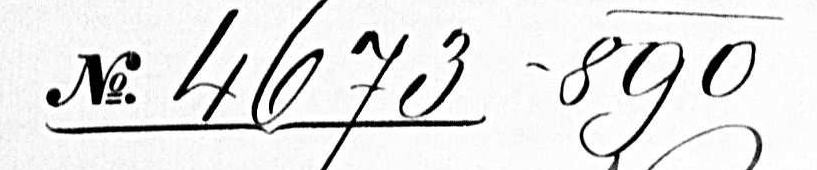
No. 4673 - 890
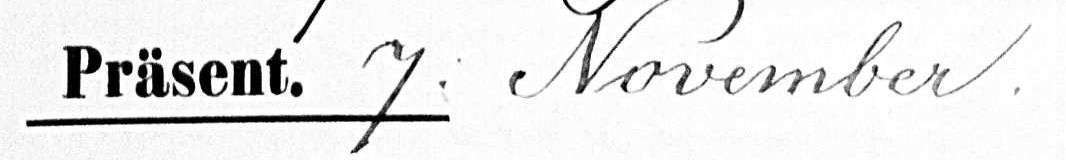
Präsent. 7. November.
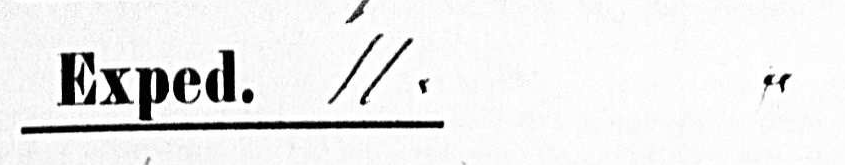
Exped. 11. November.
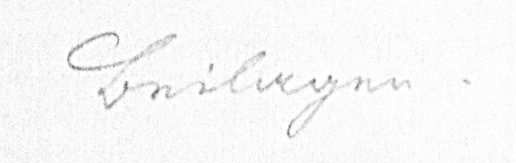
Beilagen.
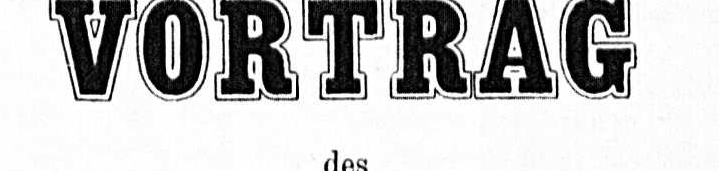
Vortrag
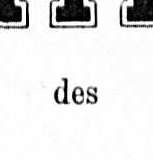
des
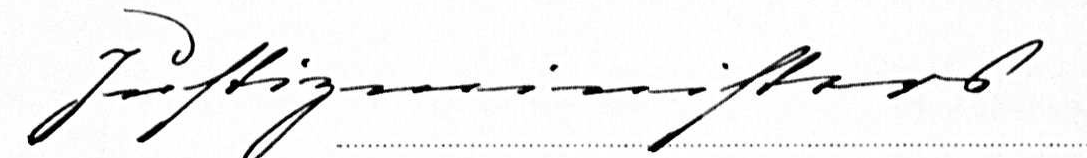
Justizministers
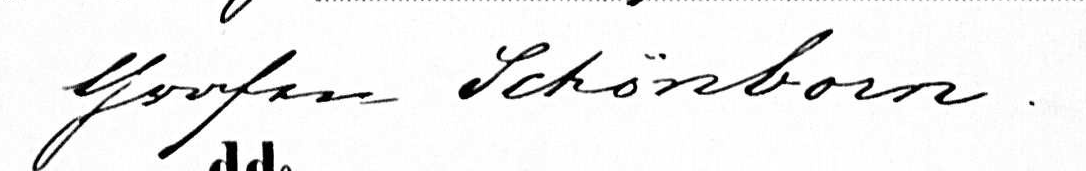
Grafen Schönborn.
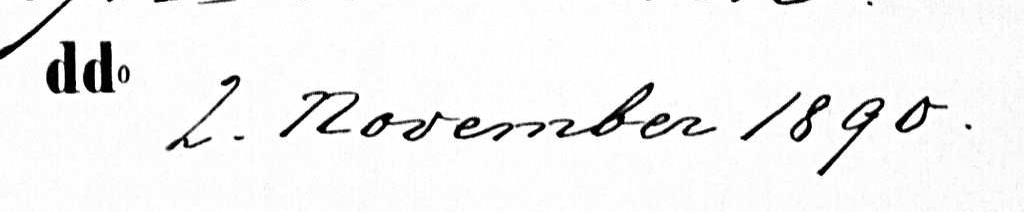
ddo 2. November 1890
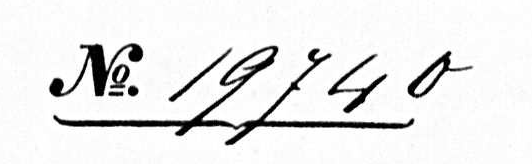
No. 19740
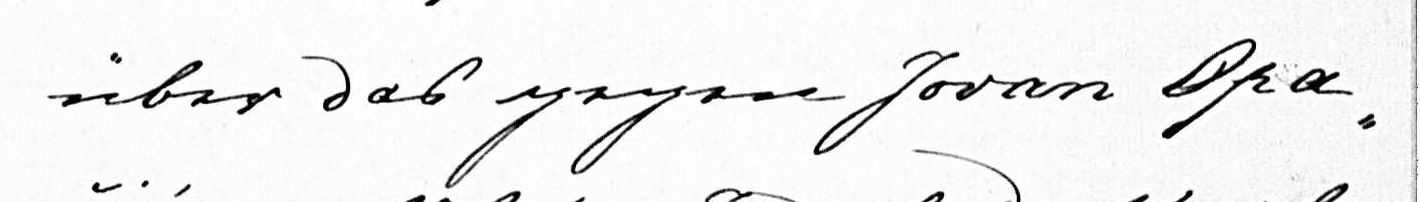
über das gegen Jovan Opa¬
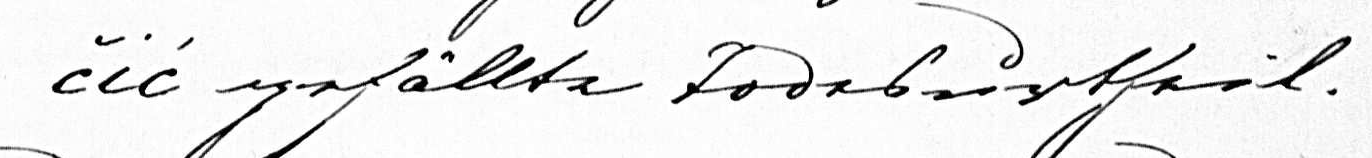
čić gefällte Todesurtheil.
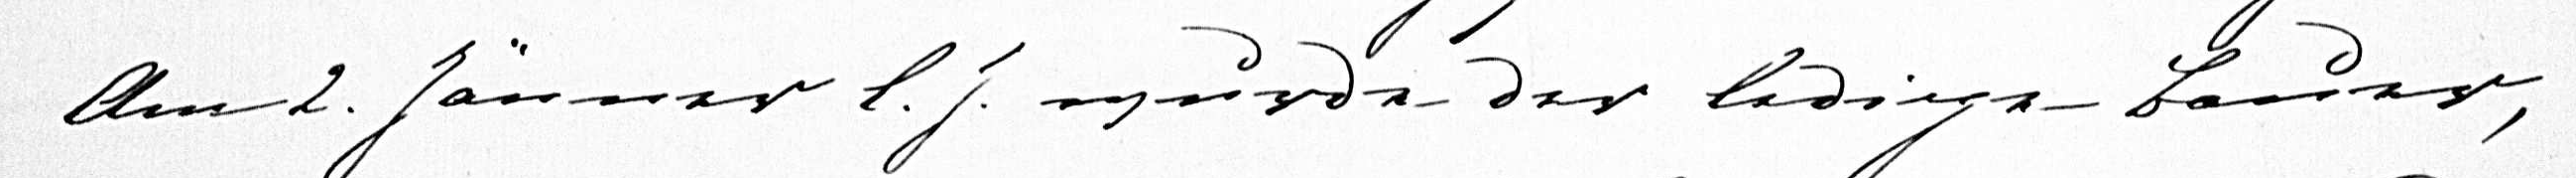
Am 2. Jänner l.J. wurde der ledige Bauer,
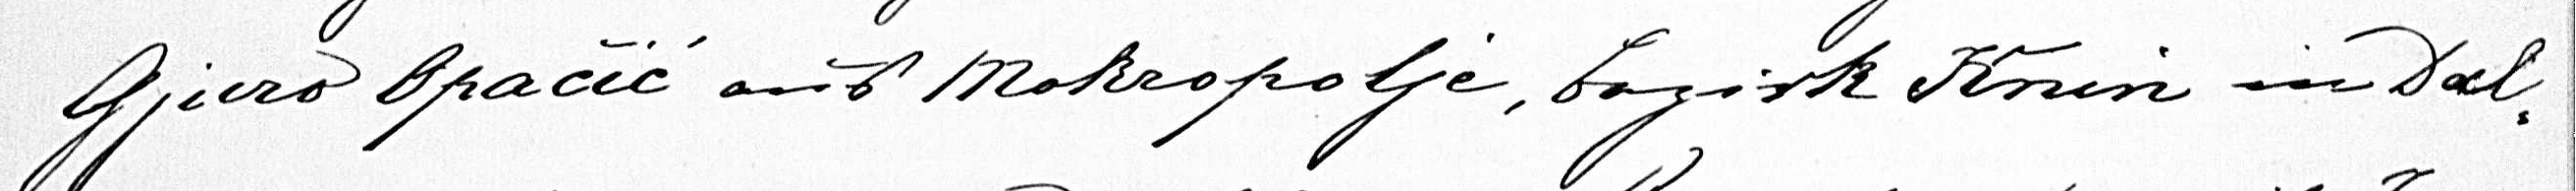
Gjuro Opačić aus Mokespolje, Bezirk Knin in Dal¬
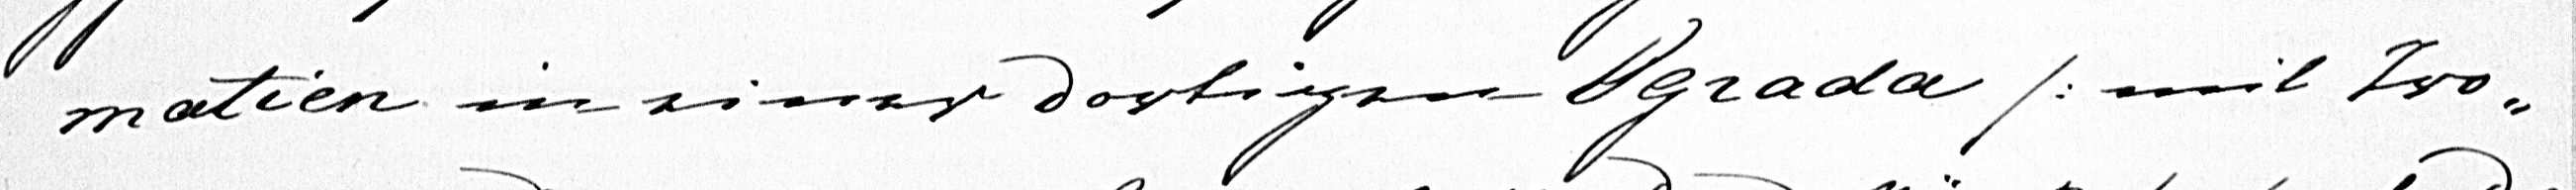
matien in einer dortigen Ograda /: mit Tro¬
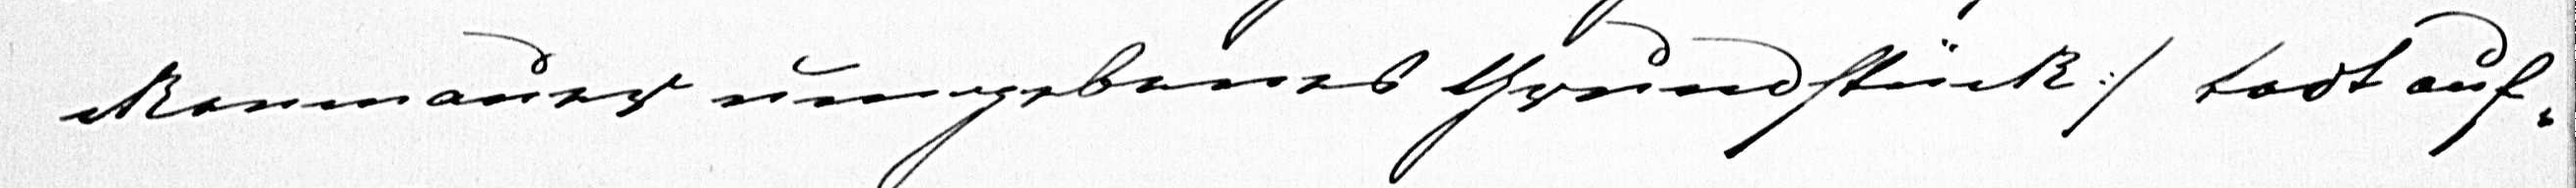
ckenmauer umgebenes Grundstück :/ todt auf¬
